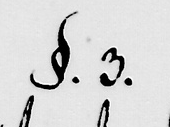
§. 3.
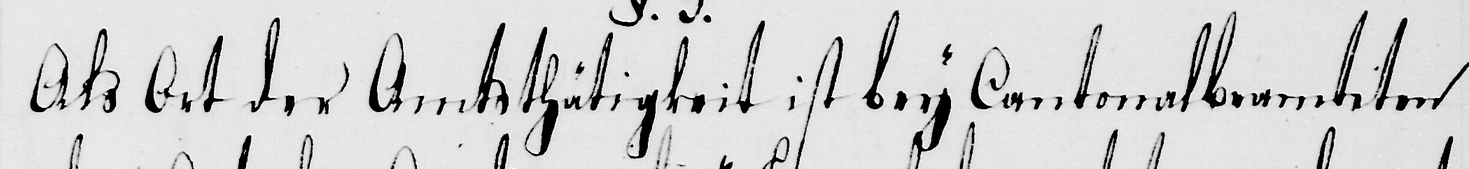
Als Ort der Amtsthätigkeit ist bey Cantonalbeamteten
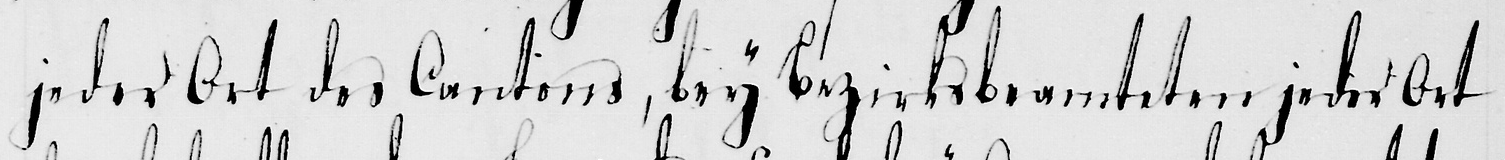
jeder Ort des Cantons, bey Bezirksbeamteten jeder Ort
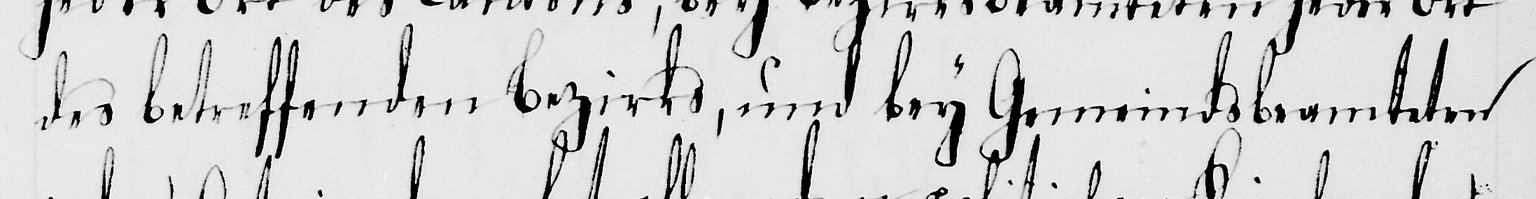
des betreffenden Bezirks, und bey Gemeindsbeamteten
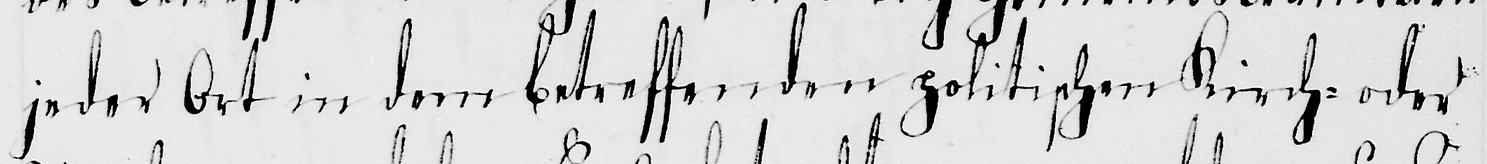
jeder Ort in dem betreffenden politischen Kirch- oder
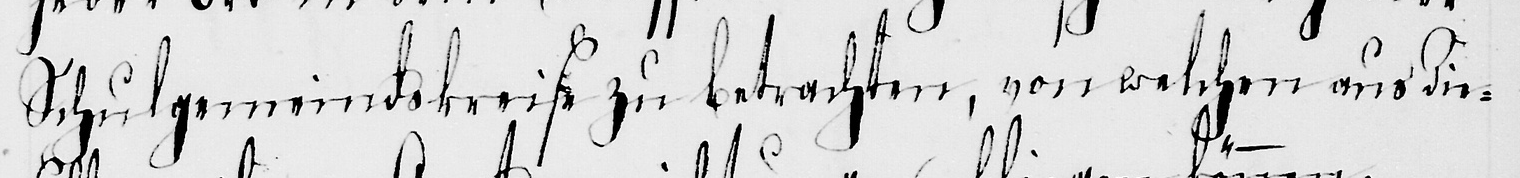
Schulgemeindskreise zu betrachten, von welchen aus die¬
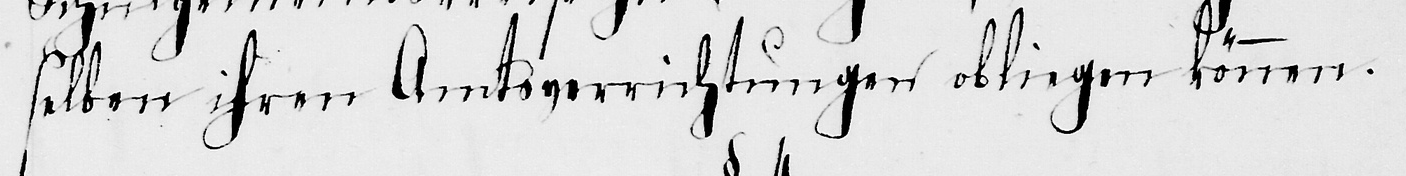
selben ihren Amtsverrichtungen obliegen können.
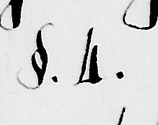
§. 4.
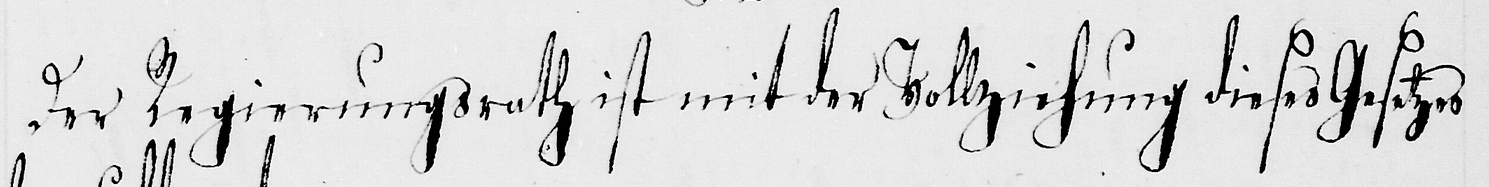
Der Regierungsrath ist mit der Vollziehung dieses Gesetz¬
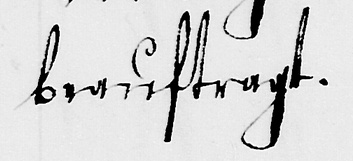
beauftragt.
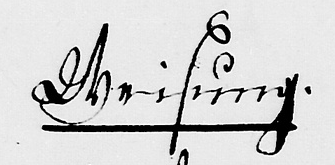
Weisung.
